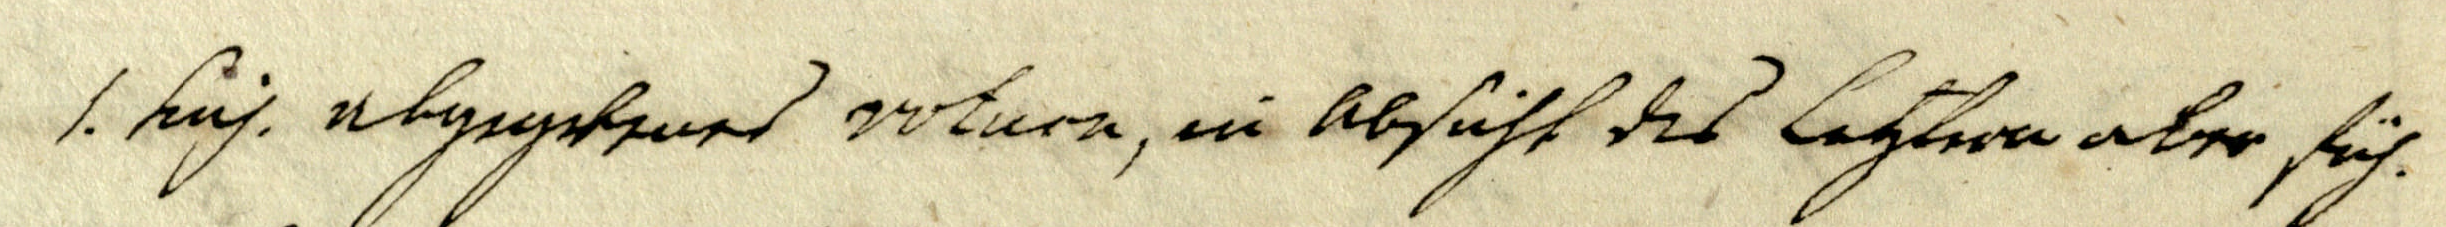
1. huj. abgegebenes votum, in Absicht des letztern aber füh¬
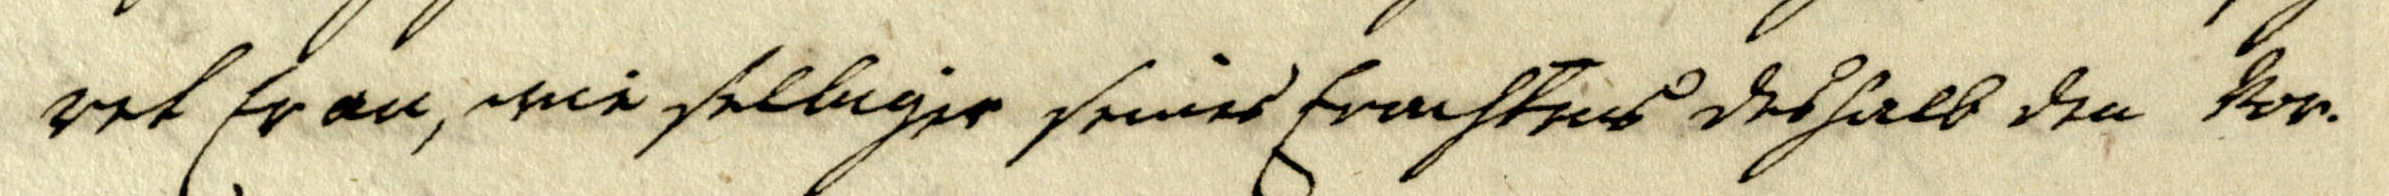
ret Er an, wie selbiger seines Erachtens deshalb den Vor¬
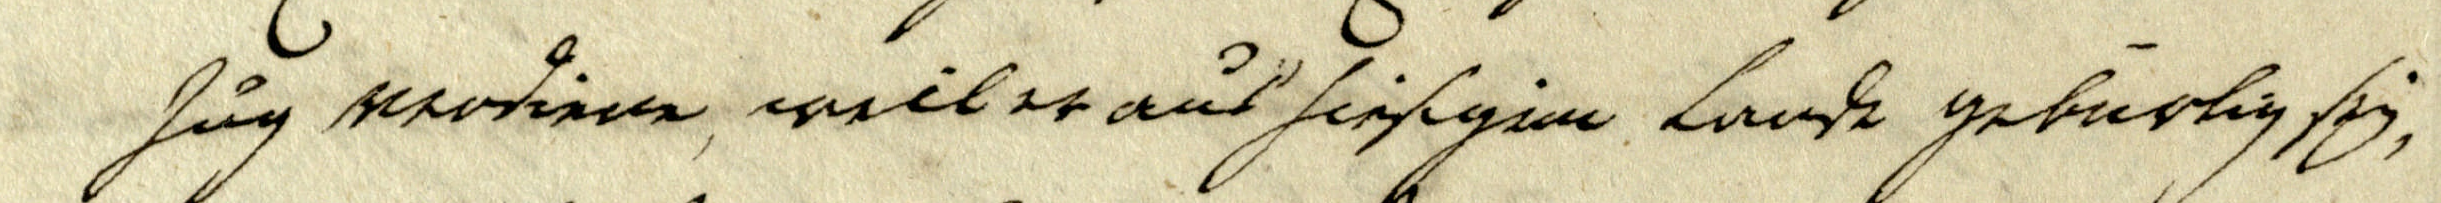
zug verdiene, weil er aus hiesigem Lande gebürtig seÿ,
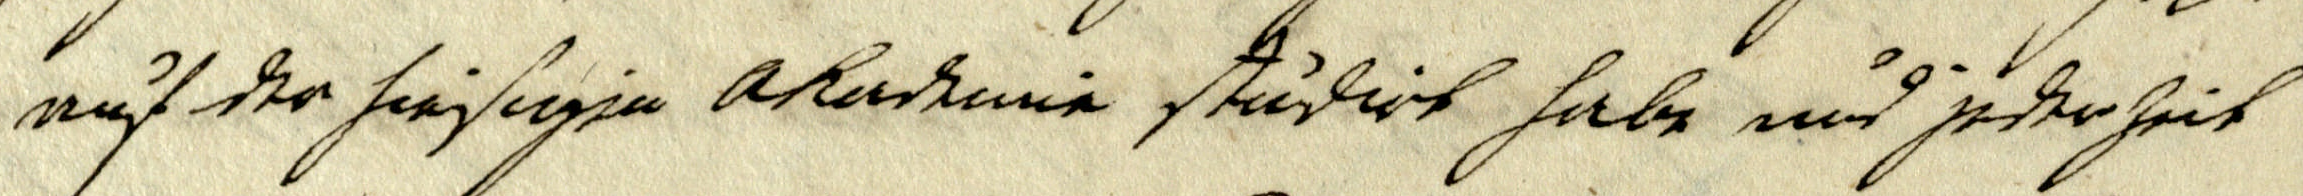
auf der hiesigen Akademie studiert habe und jeder Zeit
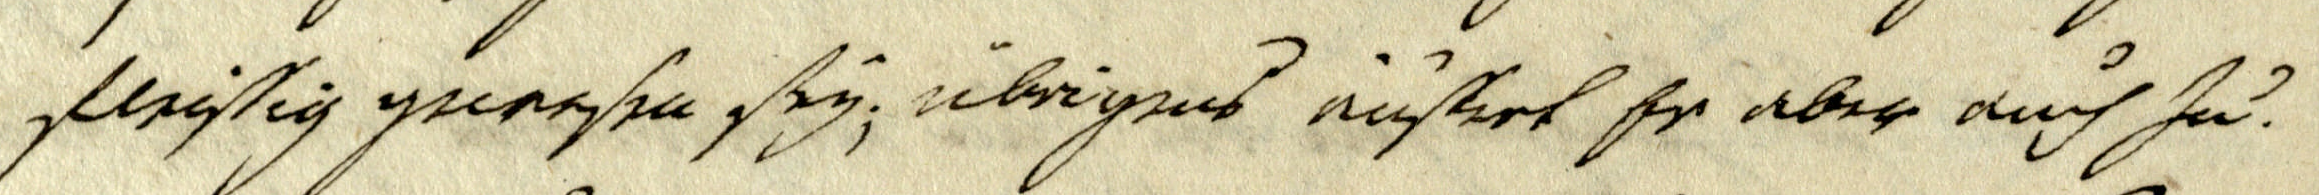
fleissig gewesen seÿ; übrigens äussert Er aber auch zu¬
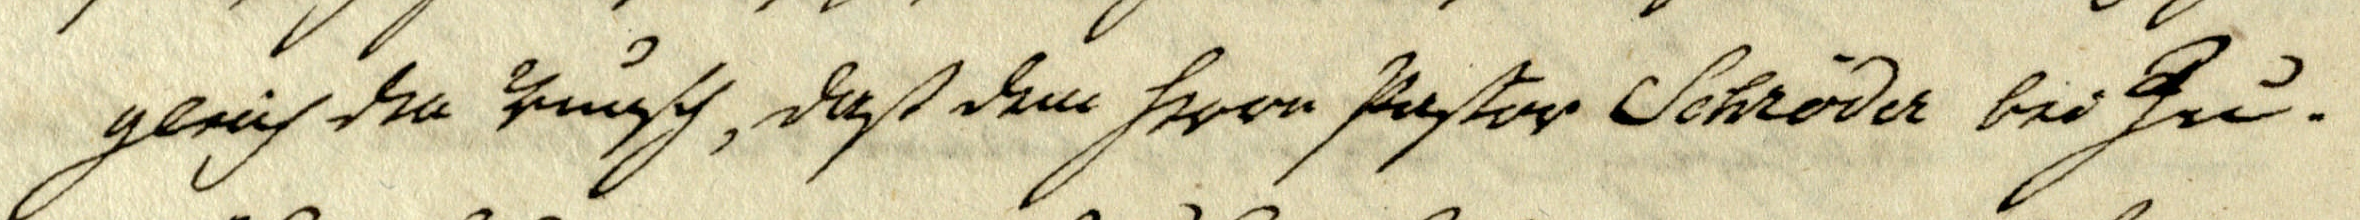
gleich den Wunsch, daß dem herrn Pastor Schröder bei Zu¬
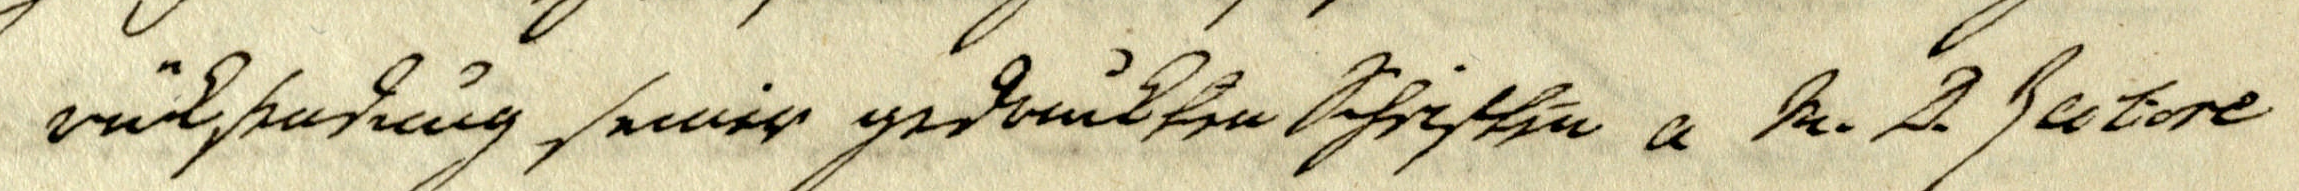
rücksendung seiner gedruckten Schriften a M. D. Rectore
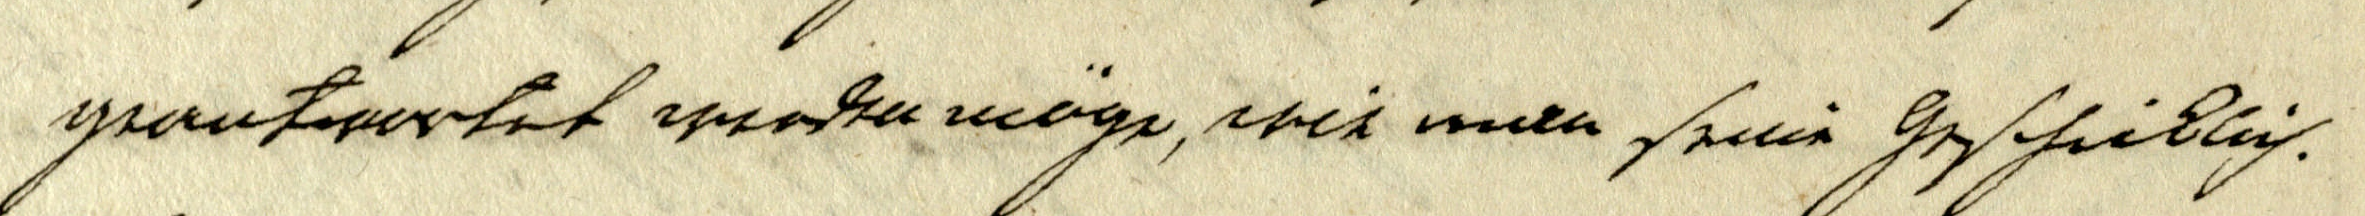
geantwortet werden möge, wie man seine Geschicklich¬
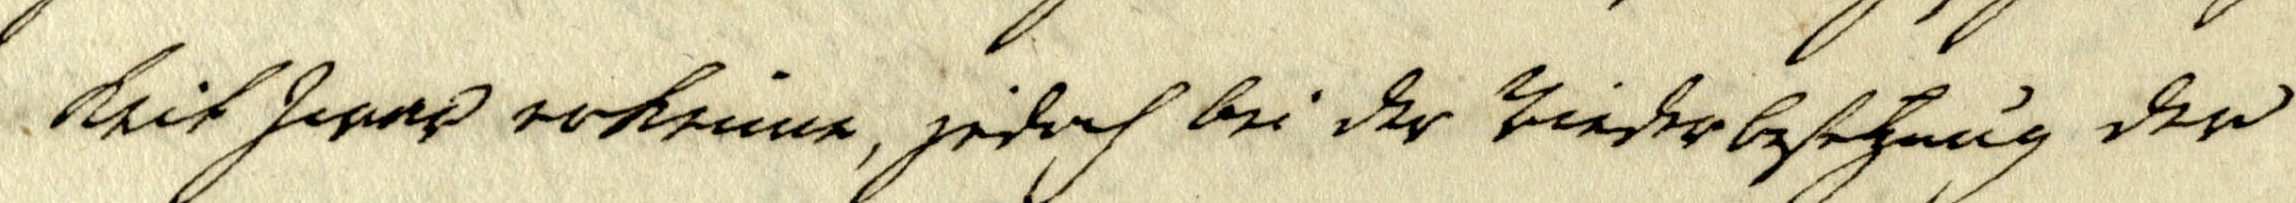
keit zwar erkenne, jedoch bei der Wiederbesetzung der
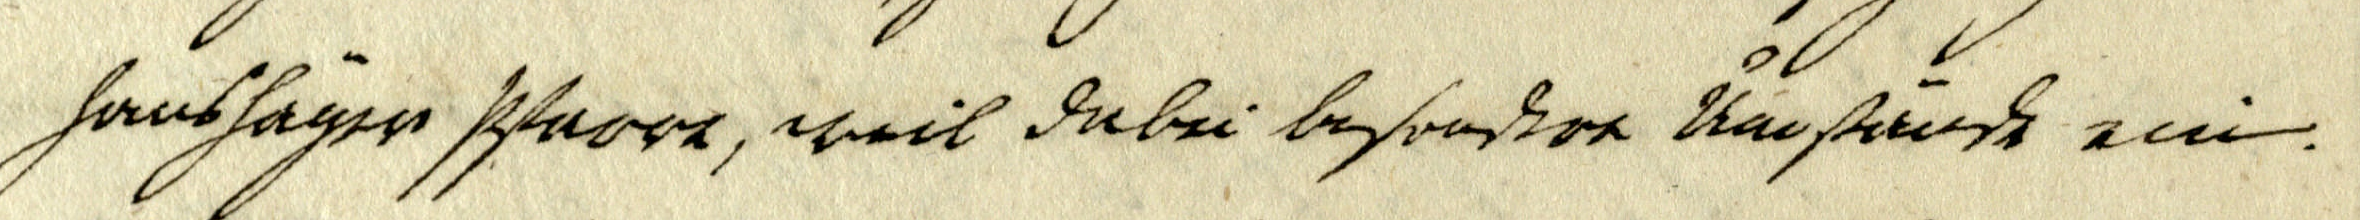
hanshäger Pfarre, weil dabei besondere Umstände ein¬
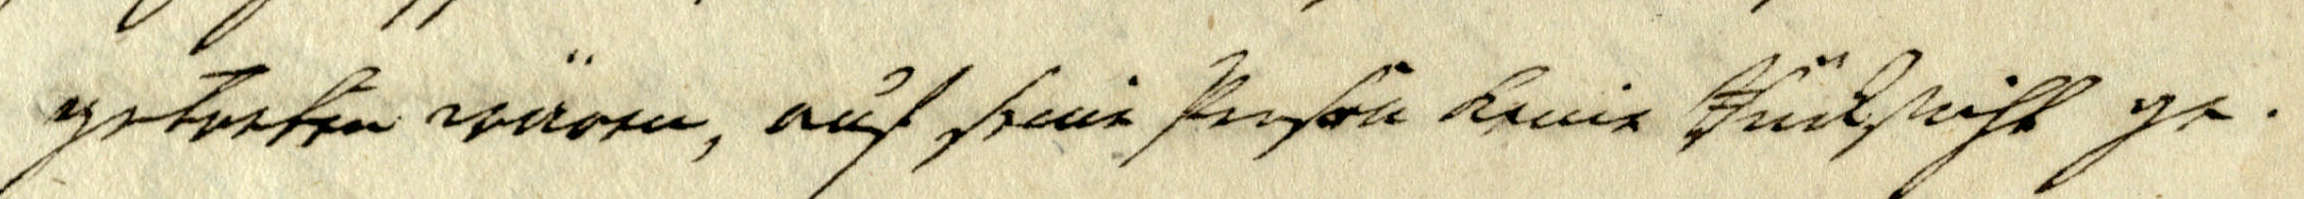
getreten wären, auf seine Person keine Rücksicht ge¬
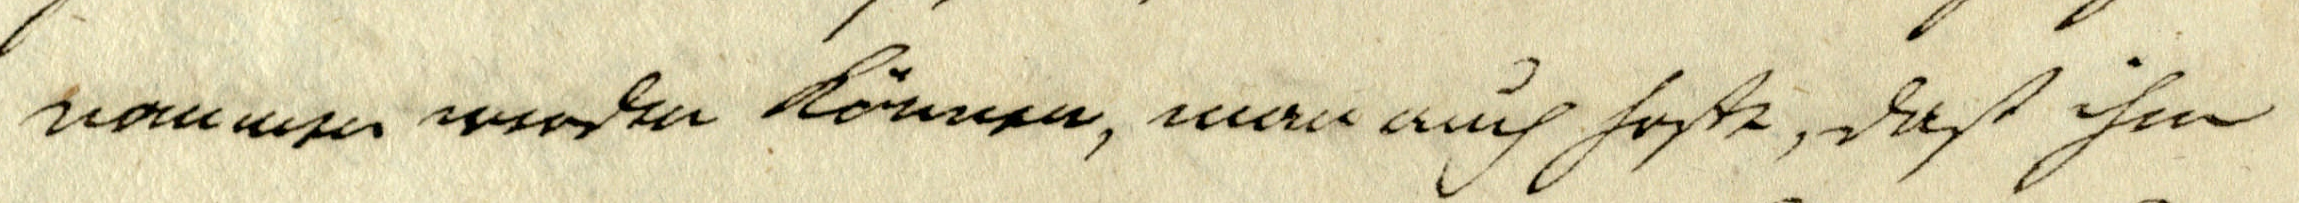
nommen werden können, man auch hoft, daß ihm
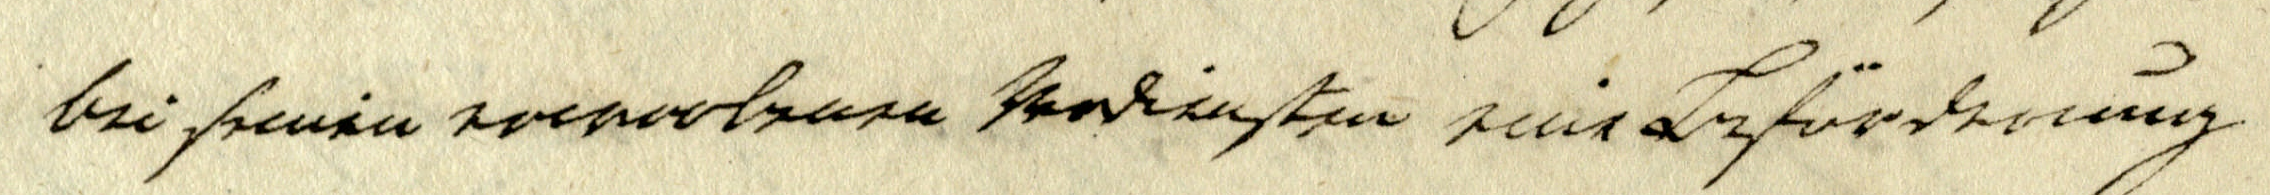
bei seinen erworbenen Verdiensten eine Beförderung
